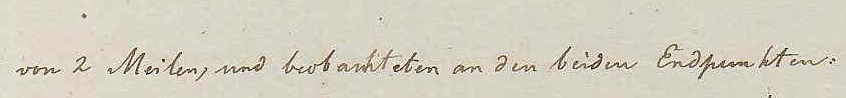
von 2 Meilen, und beobachteten an den beiden Endpunkten:
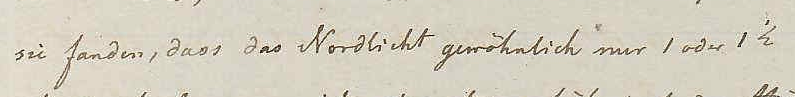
sie fanden, dass das Nordlicht gewöhnlich nur 1 oder 1½
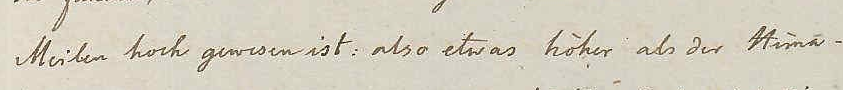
Meilen hoch gewesen ist: also etwas höher als der Hima-
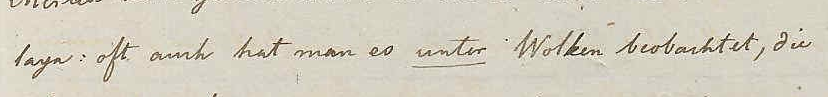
laya: oft auch hat man es unter Wolken beobachtet, die
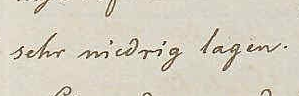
sehr niedrig lagen.
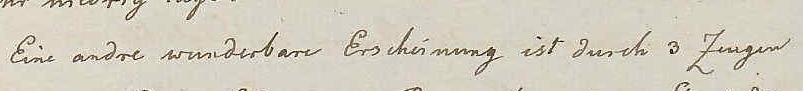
Eine andre wunderbare Erscheinung ist durch 3 Zeugen
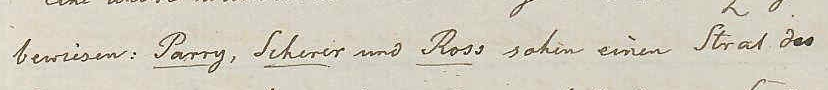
bewiesen: Parry, Scherer und Ross sahen einen Stral des
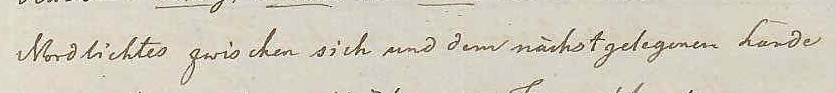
Nordlichtes zwischen sich und dem nächstgelegenen Lande
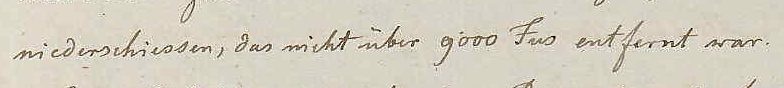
niederschiessen, das nicht über 9000 Fus entfernt war.
